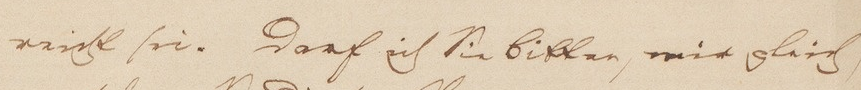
reicht sei. Darf ich Sie bitten, mir gleich,
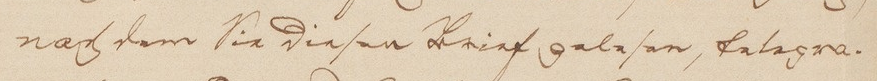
nach dem Sie diesen Brief gelesen, telegra-
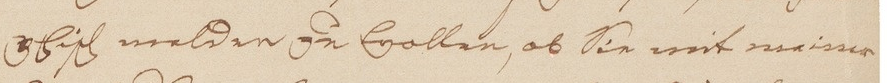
phisch melden zu wollen, ob Sie mit meiner
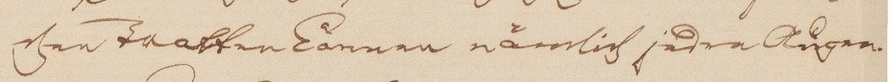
chen Tratten können nämlich jeden Augen-
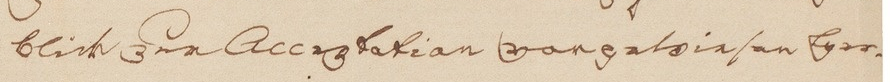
blick zur Acceptation vorgewiesen wer-
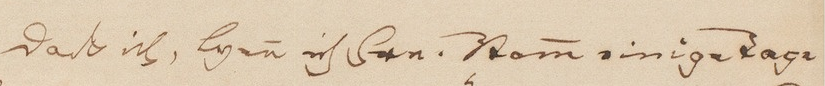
Daß ich, wenn ich Hrn. Stamm einige Tage
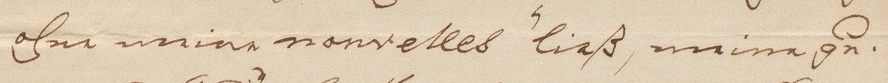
ohne meine «nouvelles» ließ, meine gu-
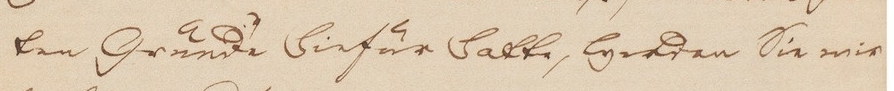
ten Gründe hiefür hatte, werden Sie mir
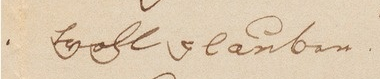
wohl glauben.
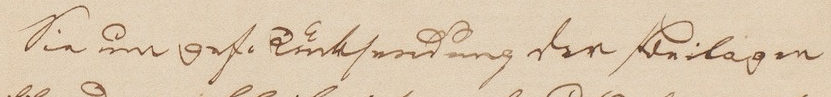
Sie um gef. Rücksendung der Beilagen
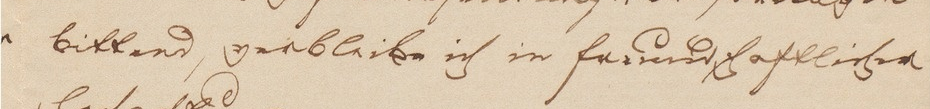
bittend, verbleibe ich in freundschaftlicher
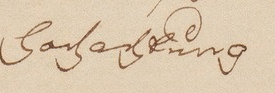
Hochachtung
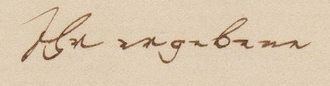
Ihr ergebene
